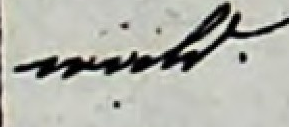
wald.
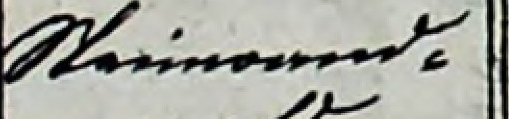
Steinwand=
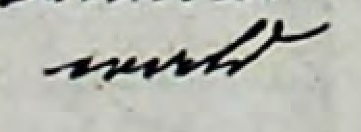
wald
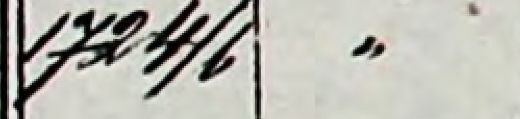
1724/b „
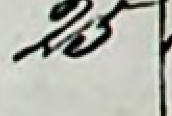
25
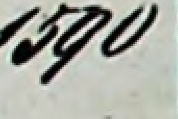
1590
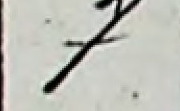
7
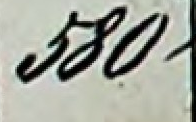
580
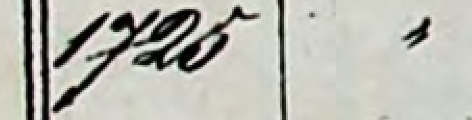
1725 „
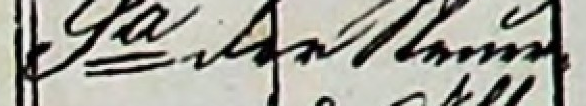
Sa der Steuer„
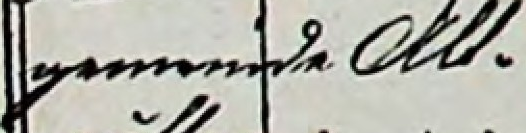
gemeinde Alt„
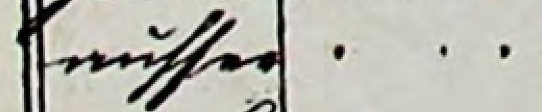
aussee ...
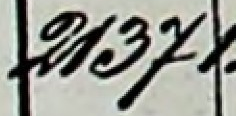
2137
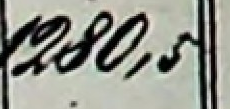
1280,5
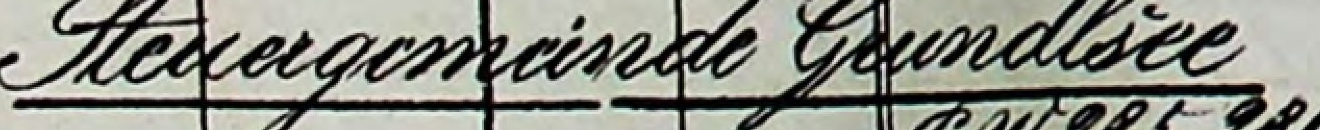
Steuergemeinde Grundlsee
